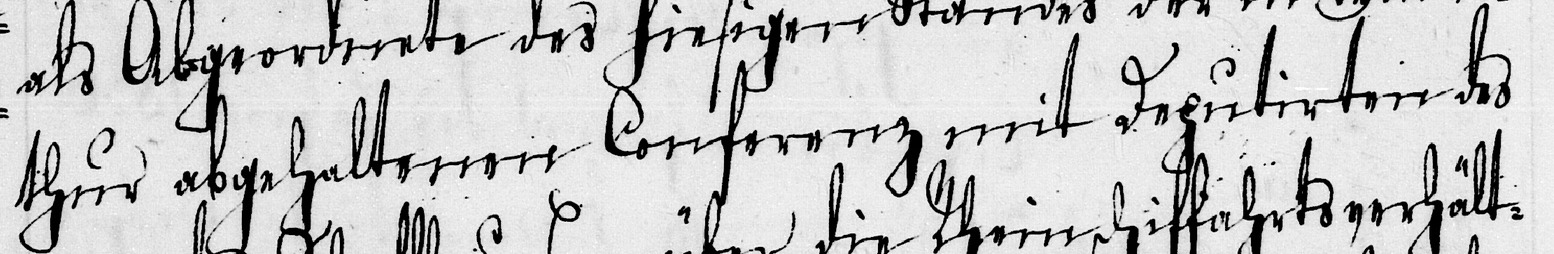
thur abgehaltenen Conferenz mit Deputirten des
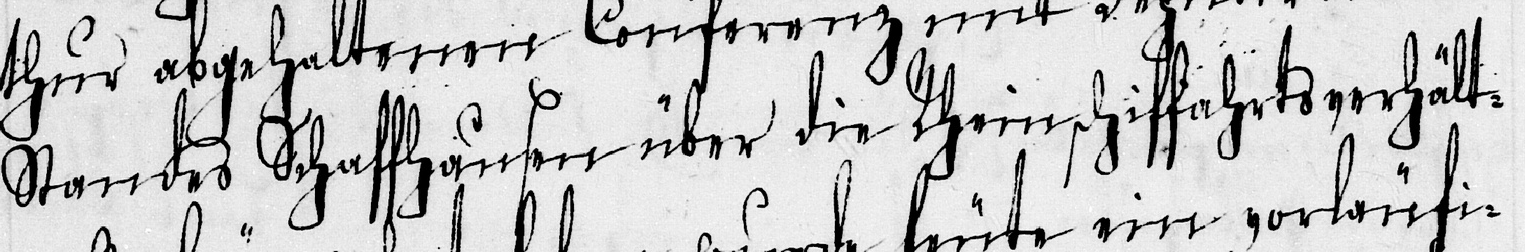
Standes Schaffhausen über die Rheinschiffahrtsverhält¬
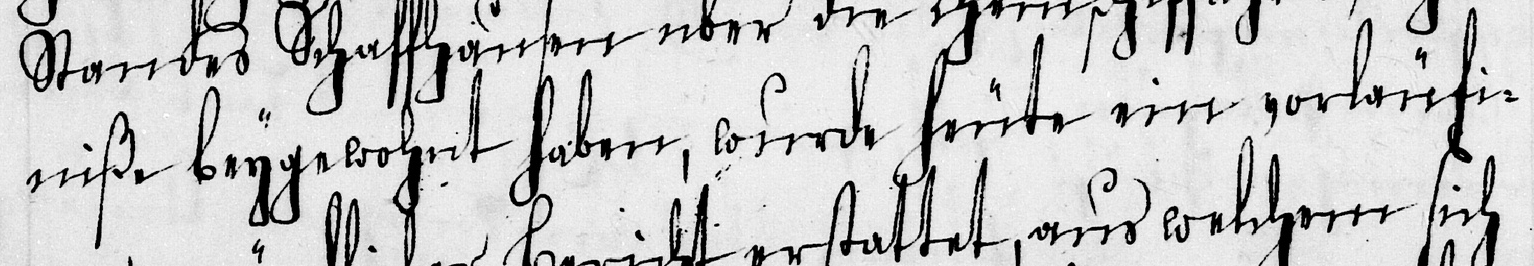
niße beygewohnt haben, wurde heute ein vorläufi¬
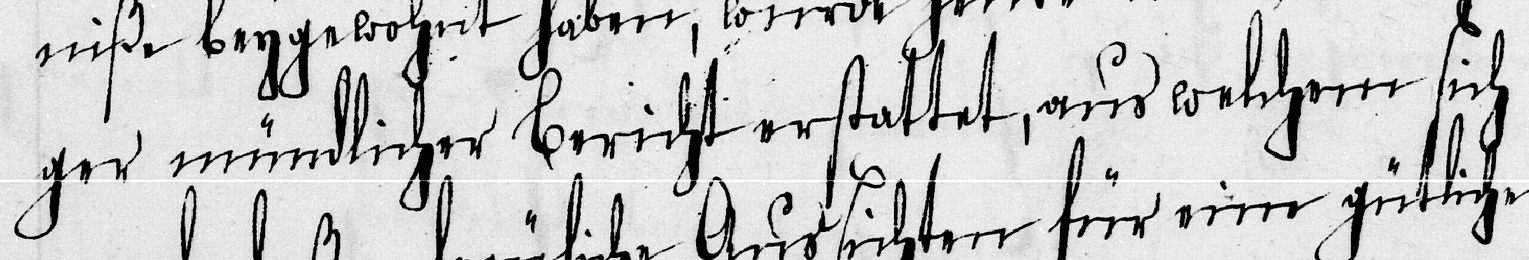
ger mündlicher Bericht erstattet, aus welchem sich
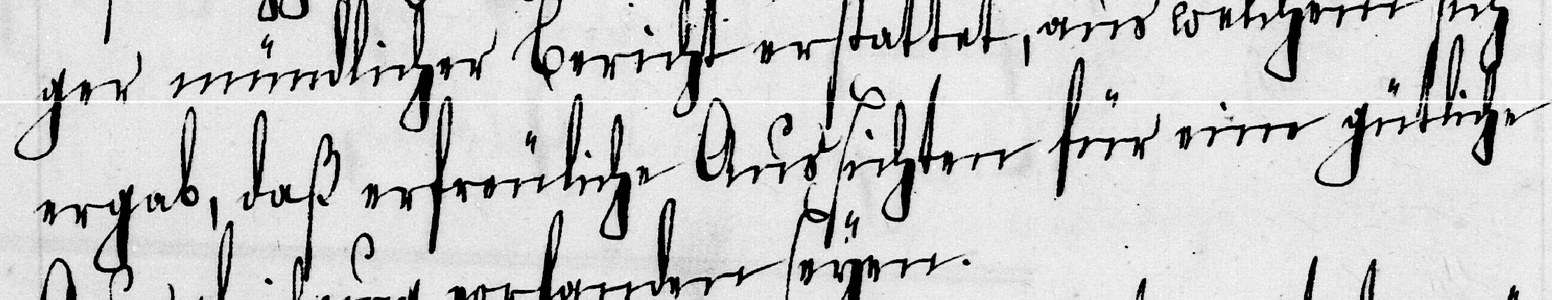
ergab, daß erfreuliche Aussichten für eine gütliche
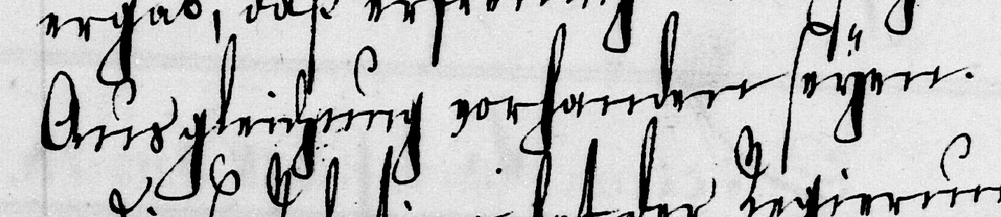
Ausgleichung vorhanden seyen.
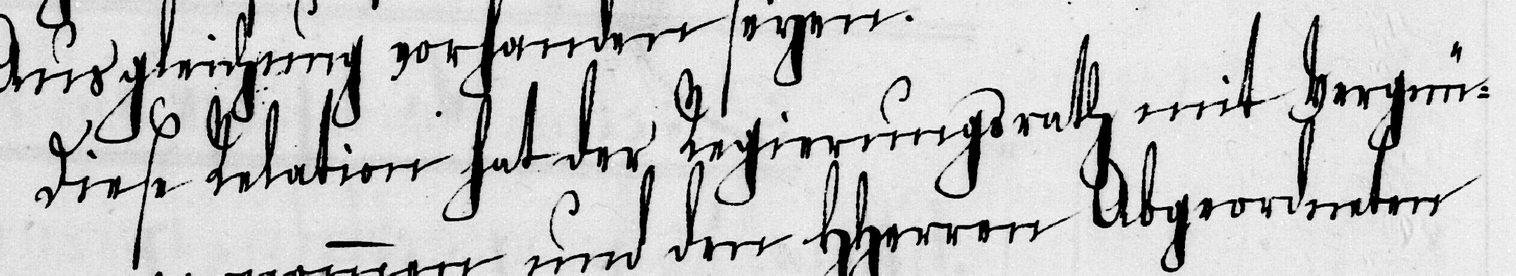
Diese Relation hat der Regierungsrath mit Vergnü¬
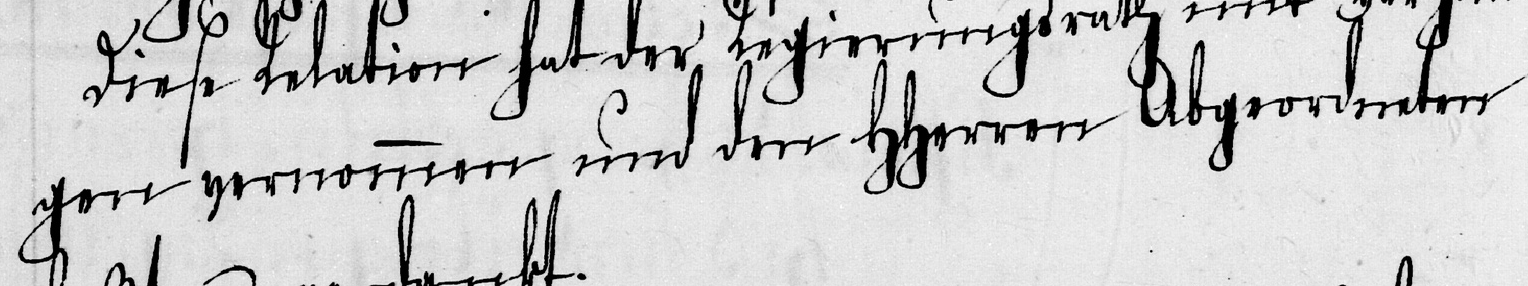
gen vernommen und den HHerren Abgeordneten
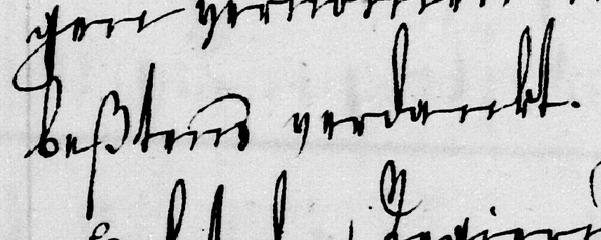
beßtens verdankt.
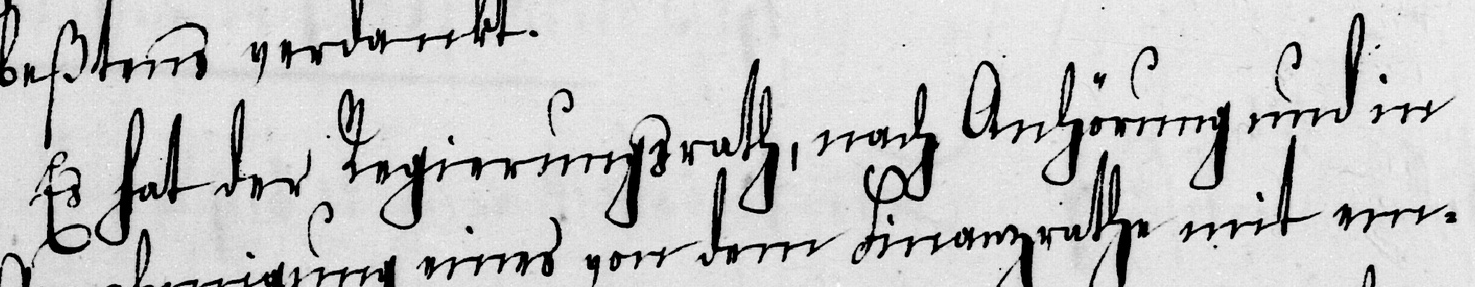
Es hat der Regierungsrath, nach Anhörung und in
